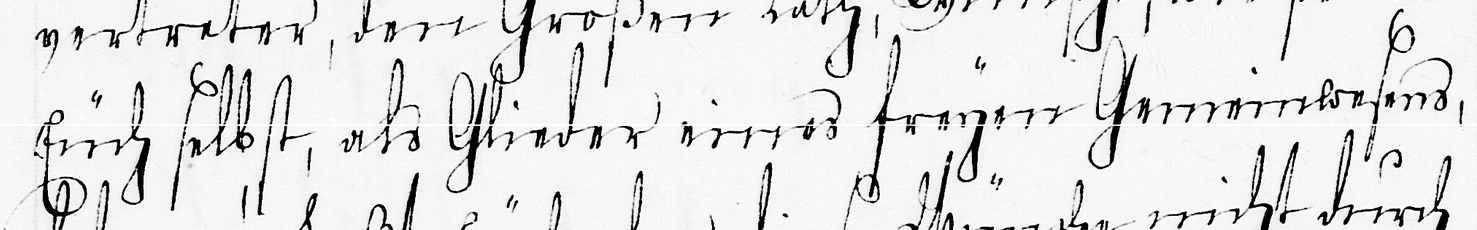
Euch selbst, als Glieder eines freyen Gemeindswesens,
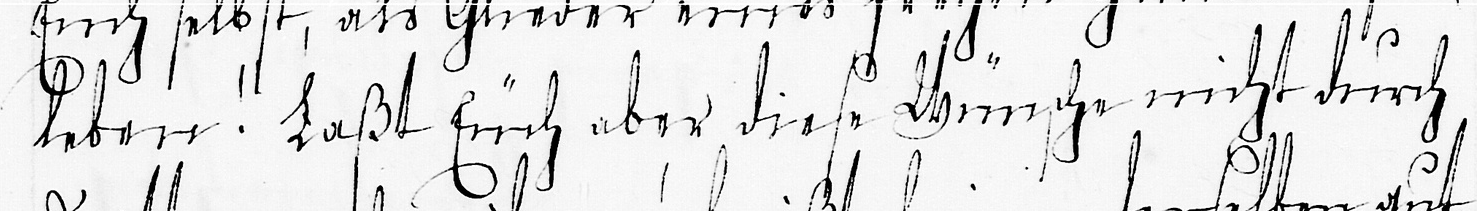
leben! Laßt Euch aber diese Wünsche nicht durch
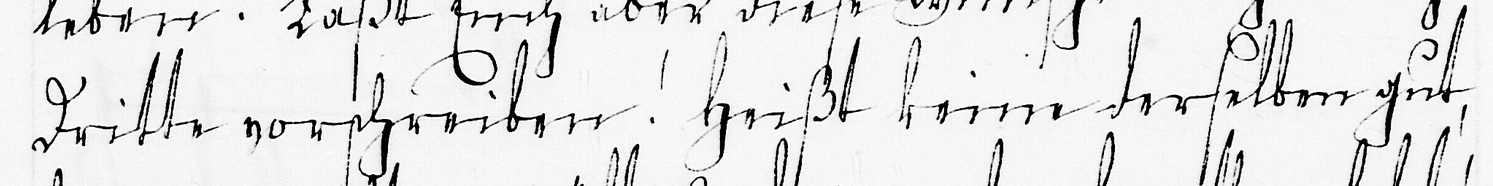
Dritte vorschreiben! Heißt keine derselben gut,
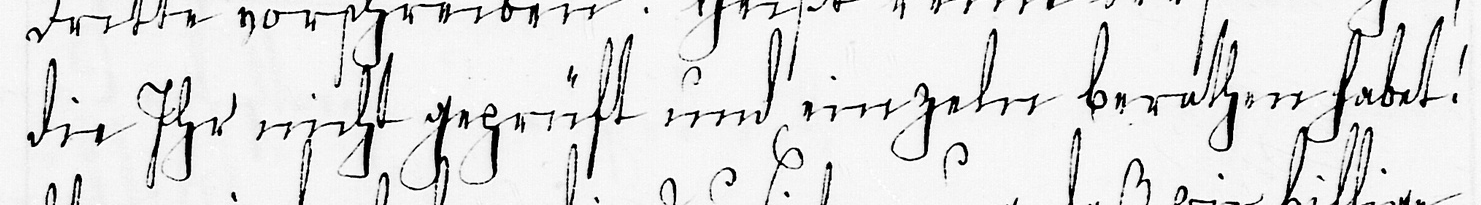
die Ihr nicht geprüft und einzeln berathen habet!
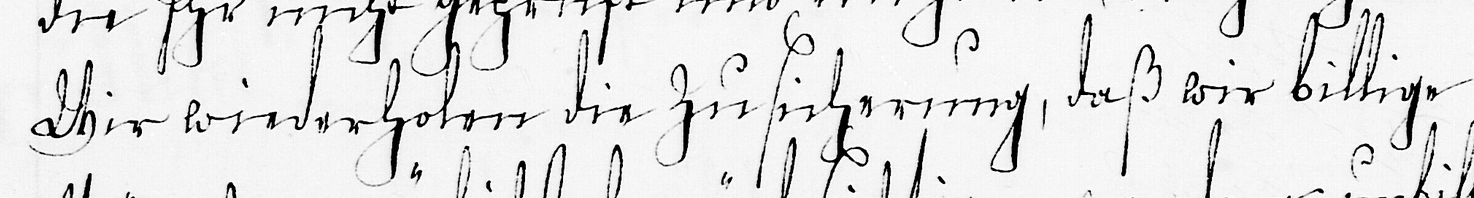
Wir wiederholen die Zusicherung, daß wir billige
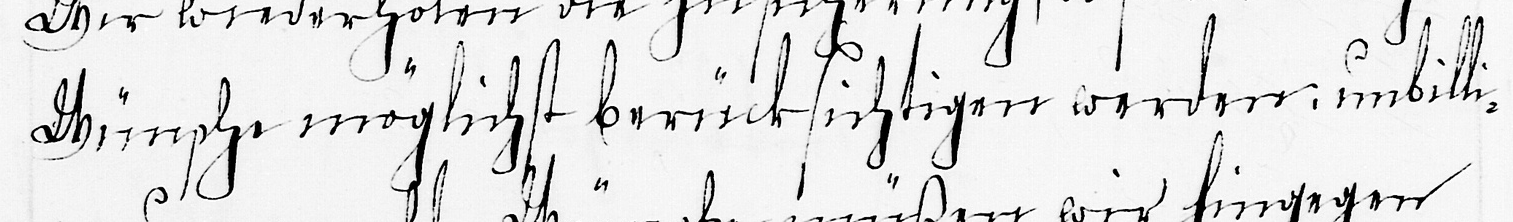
Wünsche möglichst berücksichtigen werden; unbilli¬
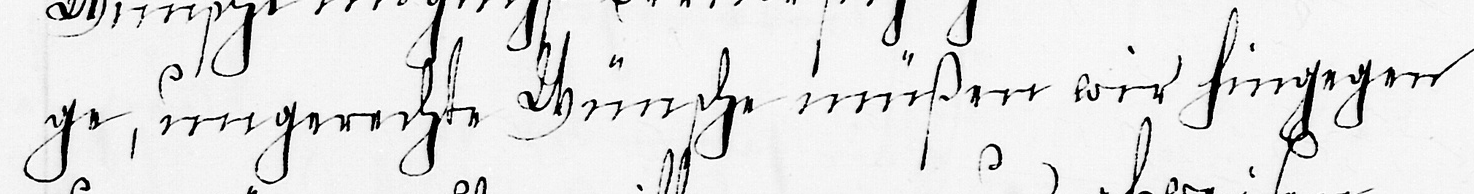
ge, ungerechte Wünsche müßen wir hingegen
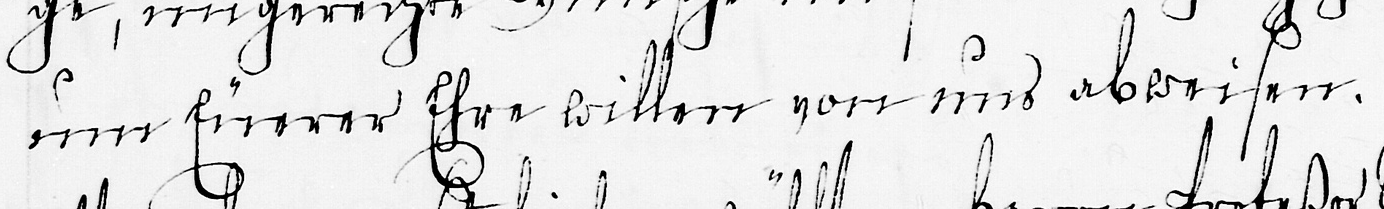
um Euerer Ehre willen von uns abweisen.
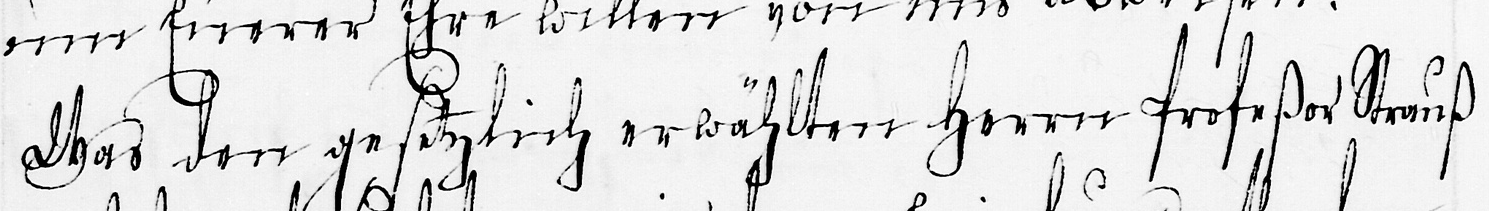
Was den gesetzlich erwählten Herrn Profeßor Strauß
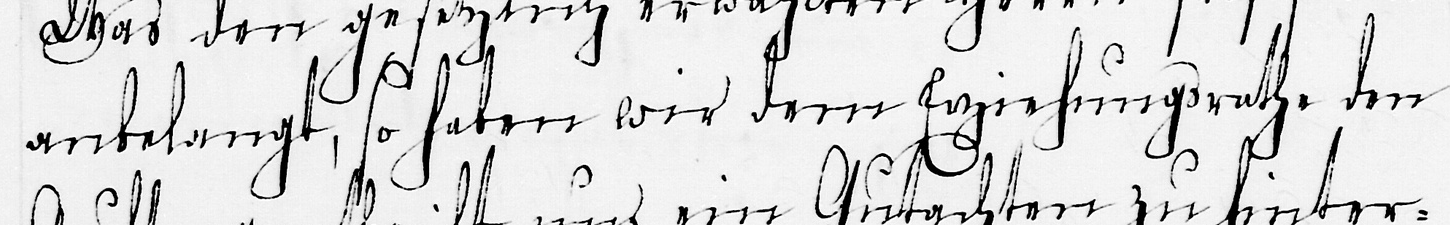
anbelangt, so haben wir dem Erziehungsrathe den
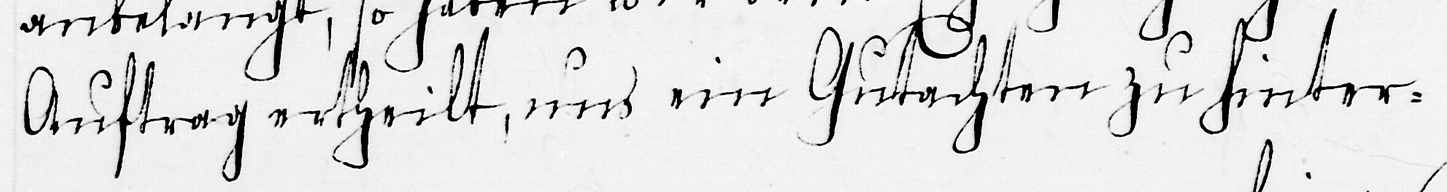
Auftrag ertheilt, uns ein Gutachten zu hinter-
